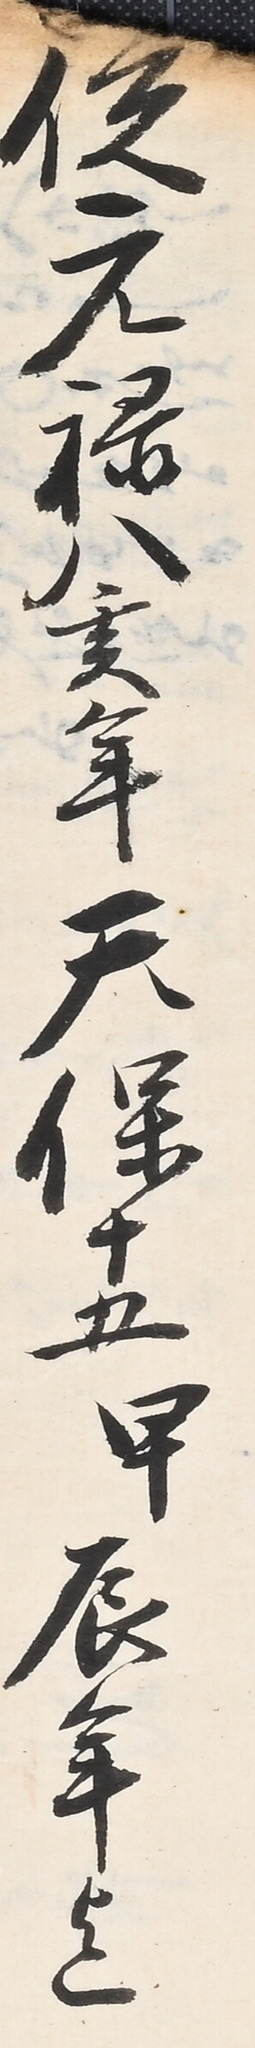従元禄八亥年天保十五甲辰迄
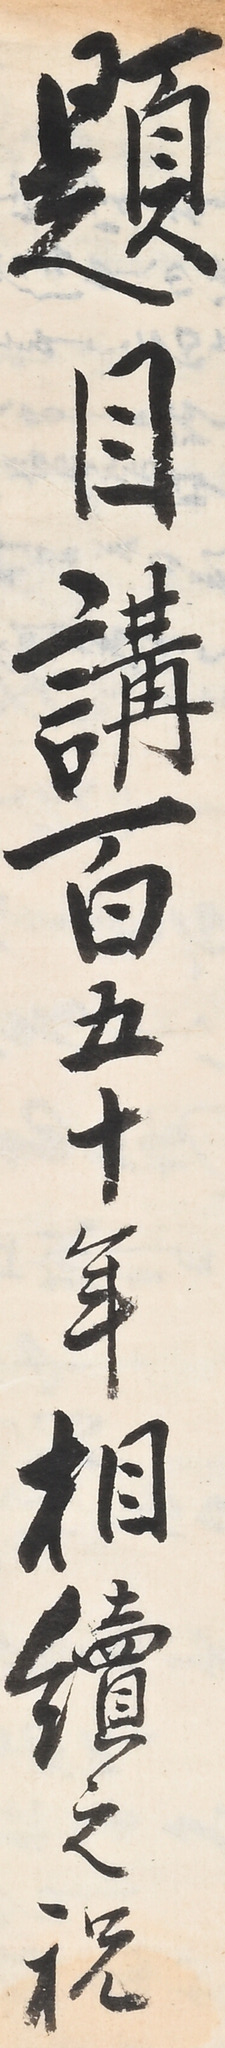題目講百五十年相続之祝
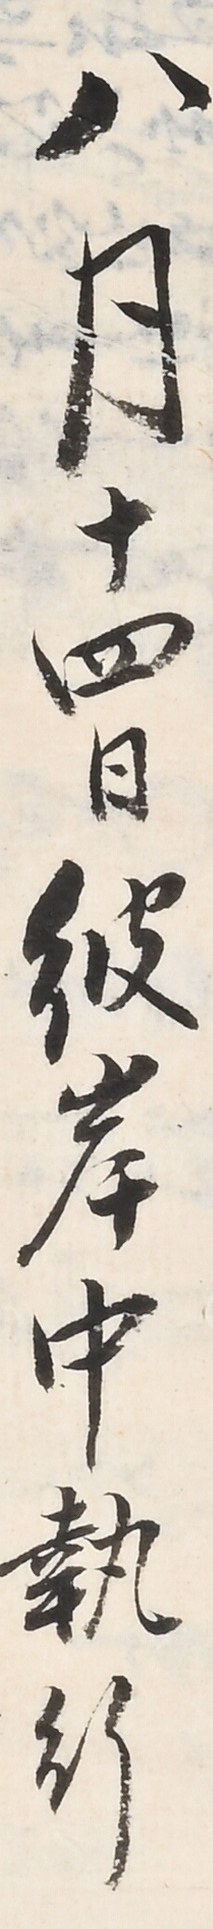八月十四日彼岸中執行
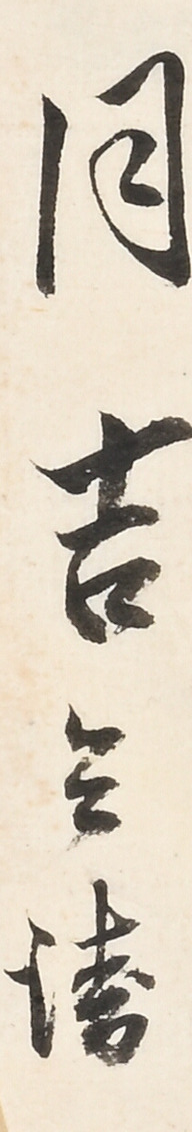同吉兵衛

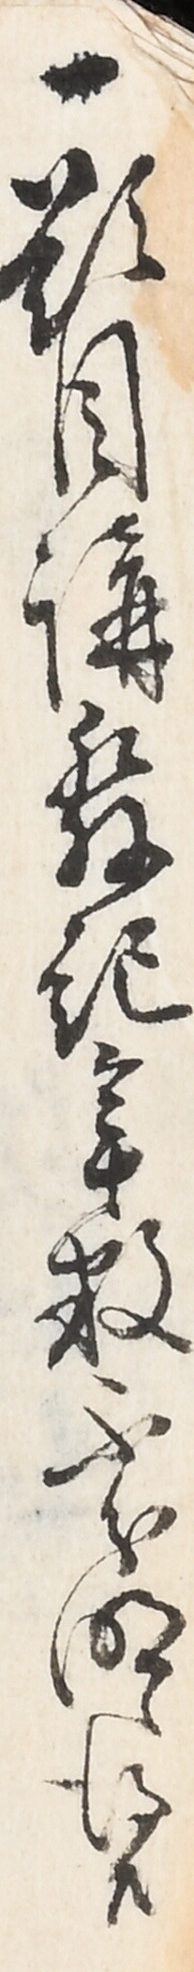一題目講発記年数不分明候得共
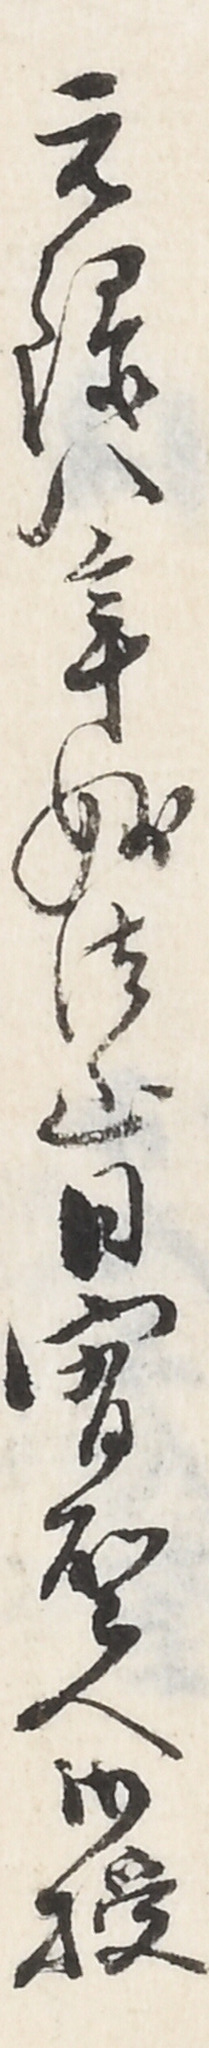元禄八年妙法山日宥聖人御授
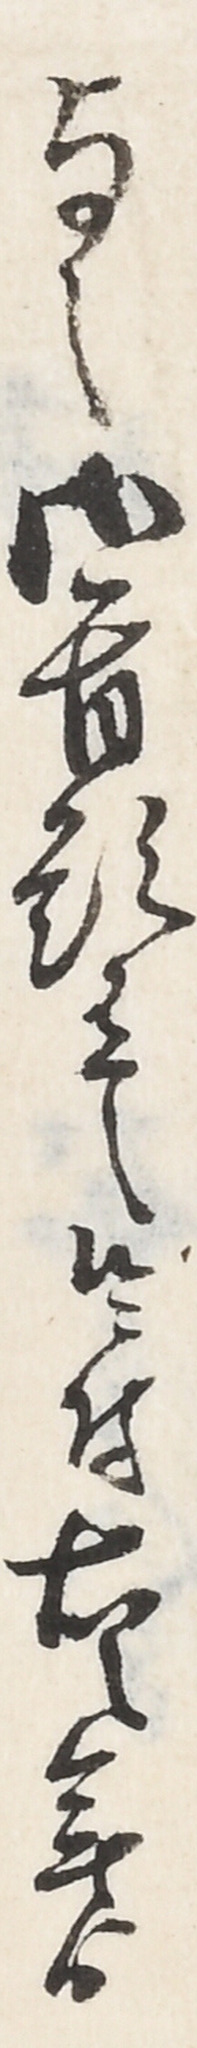与之御首題有之候ニ不右之年ゟ
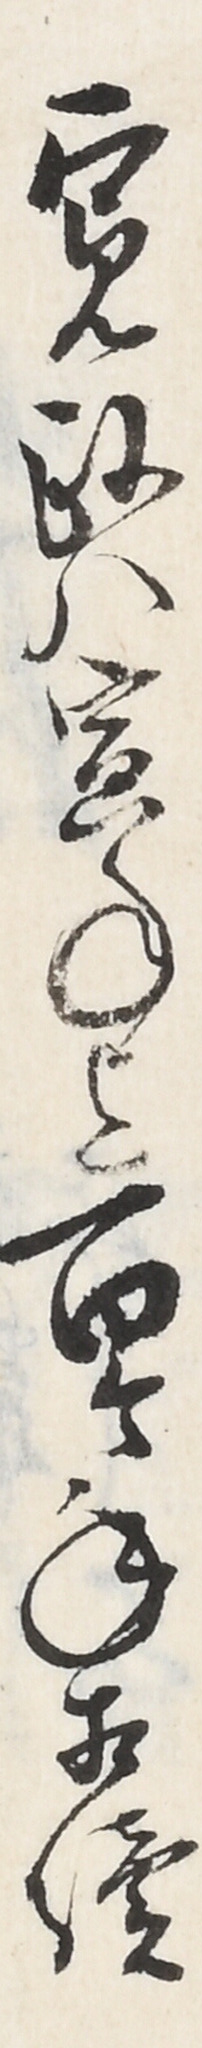寛政八寅年迄百ヶ年相続
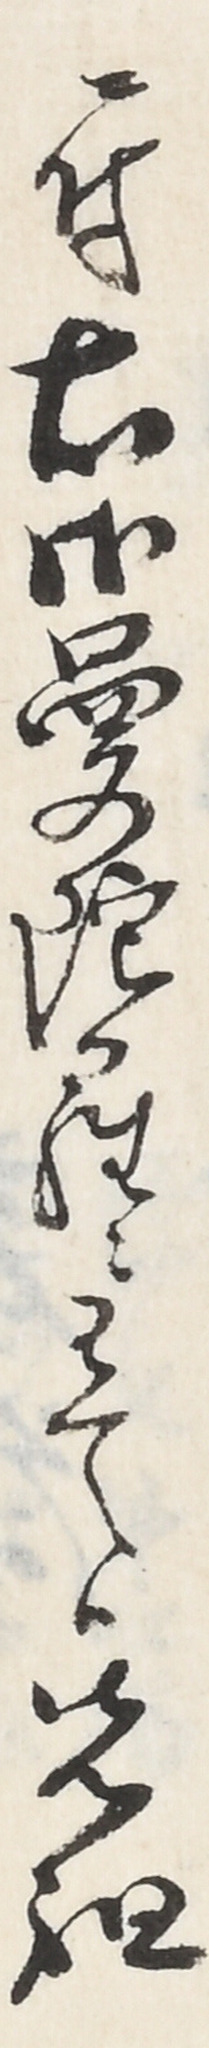ニ付右御曼陀羅ニ有之候先祖
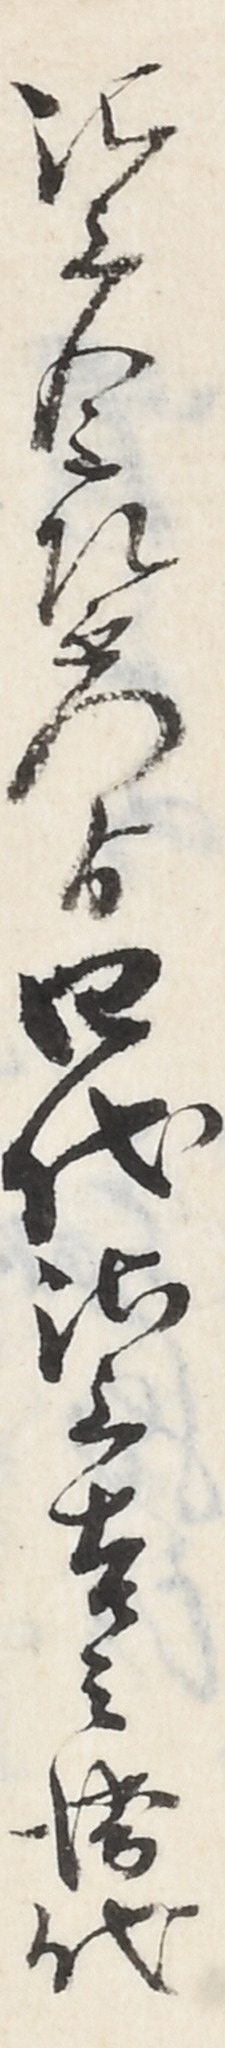池上金左衛門ゟ四代池上吉兵衛代
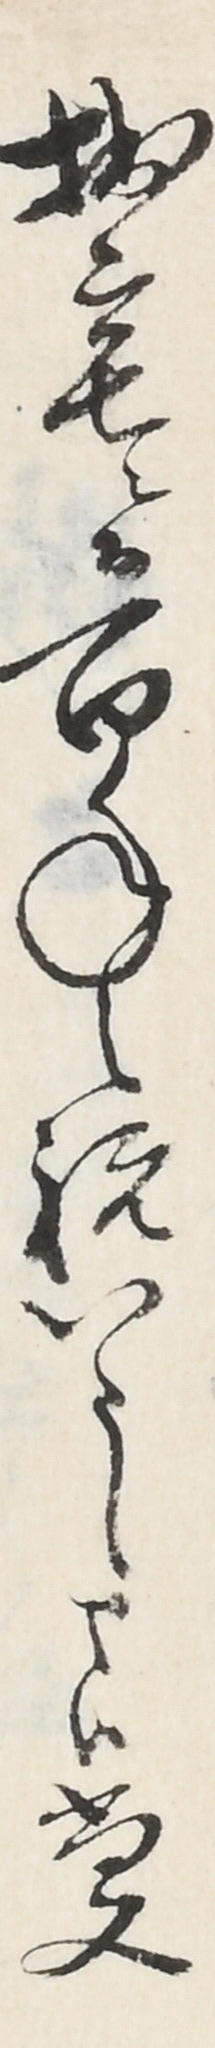拙宅ニ而百年之祝いたし申候尚又
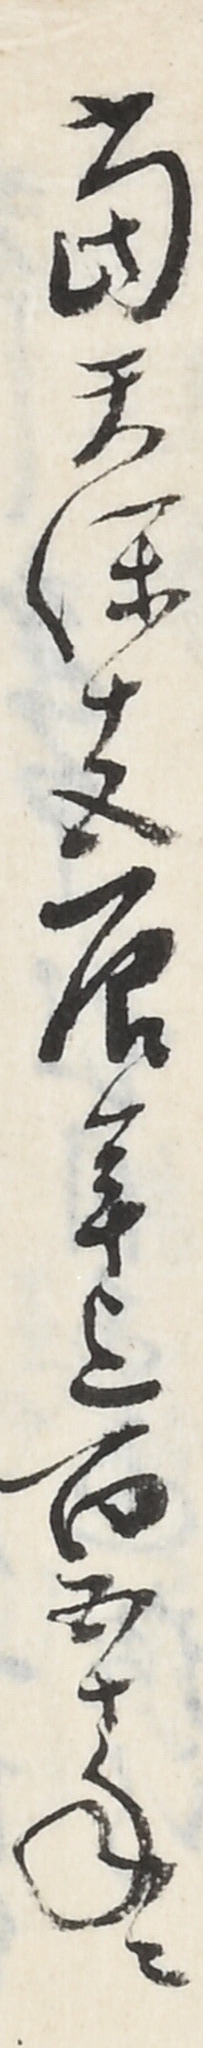当天保十五辰年迄百五十年ニ

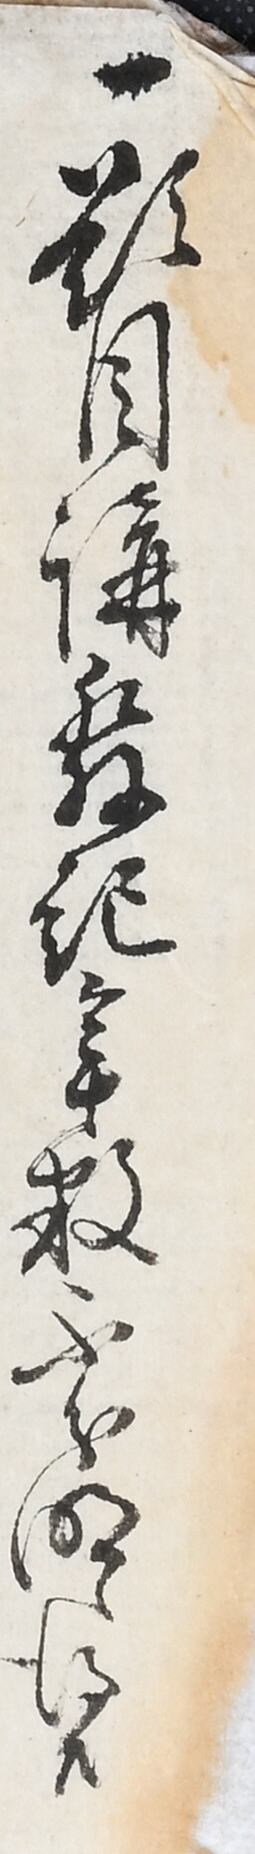一題目講発記年数不分明候得共
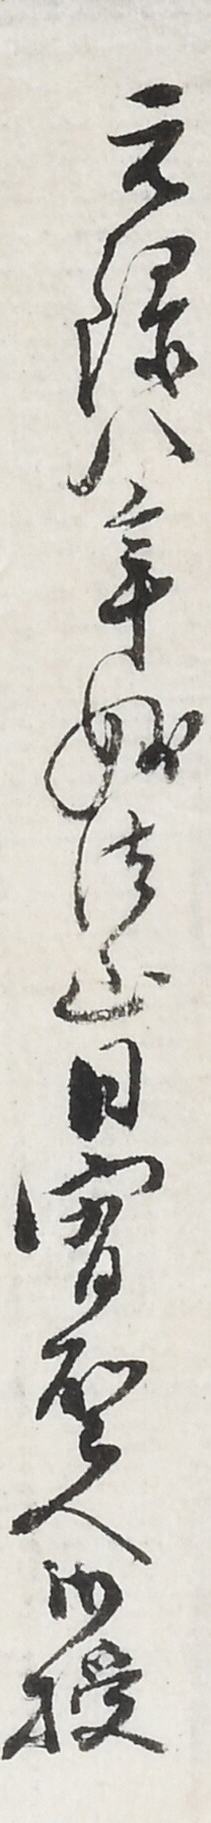元禄八年妙法山日宥聖人御授
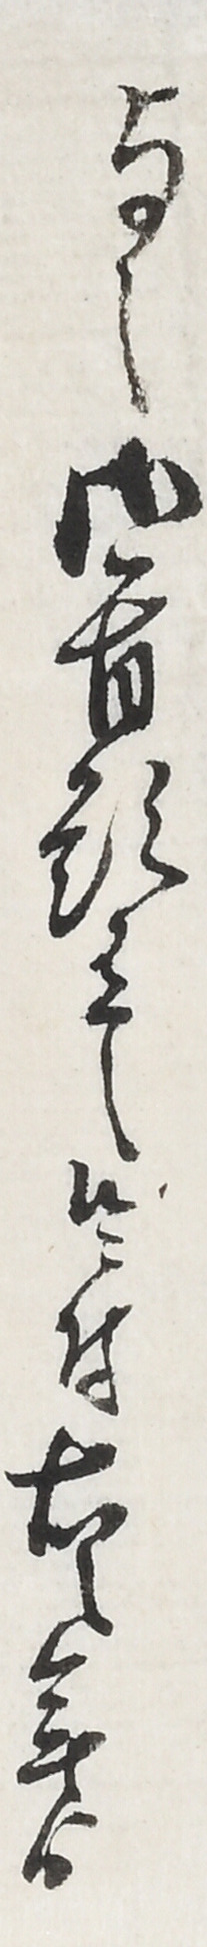与之御首題有之候ニ不右之年ゟ
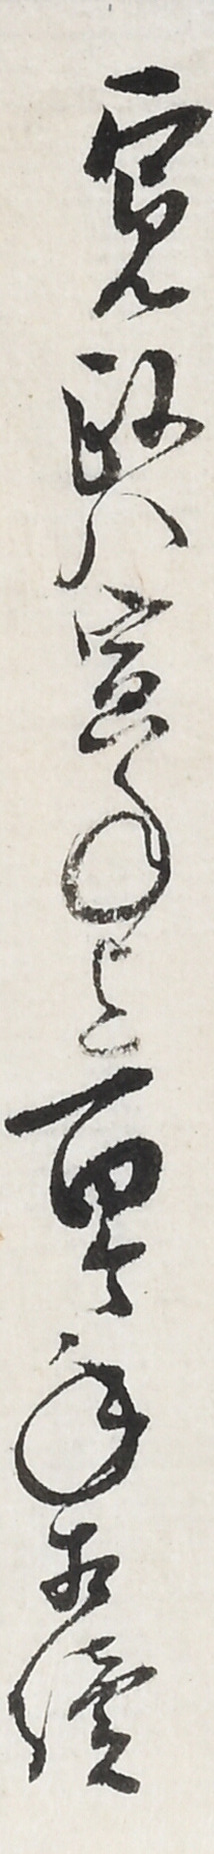寛政八寅年迄百ヶ年相続
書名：従元禄八亥年天保十五甲辰年迄題目講百五十年相續之祝
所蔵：伊那市立高遠町図書館・合同会社AMANE
